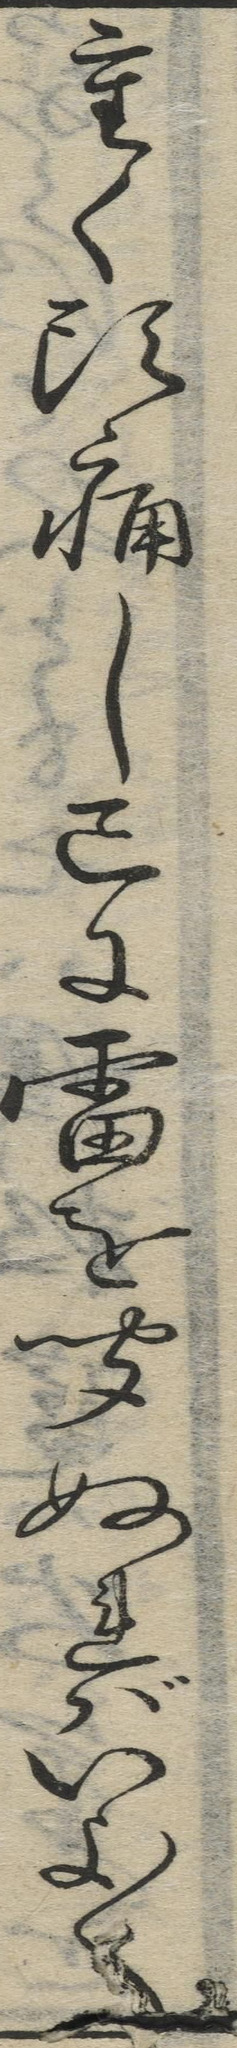重く頭痛し己に雷を聞ぬればいよ〳〵
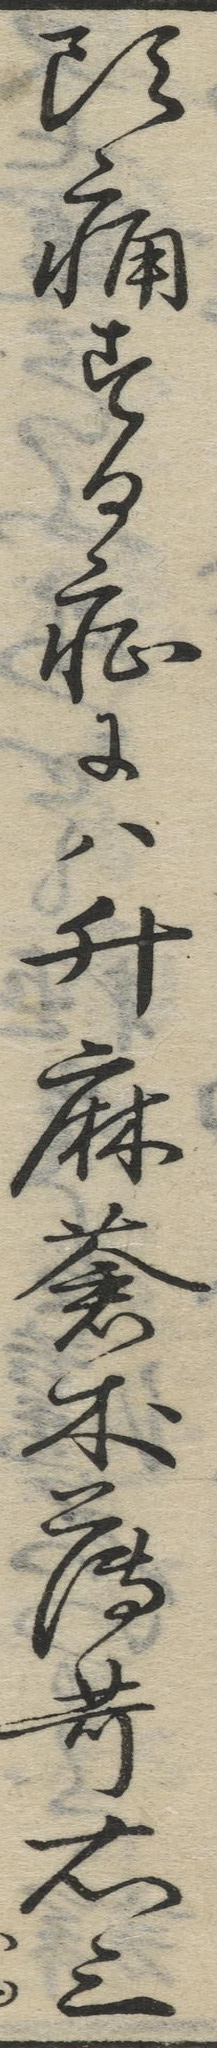頭痛する症には升麻蒼木薄苛右三
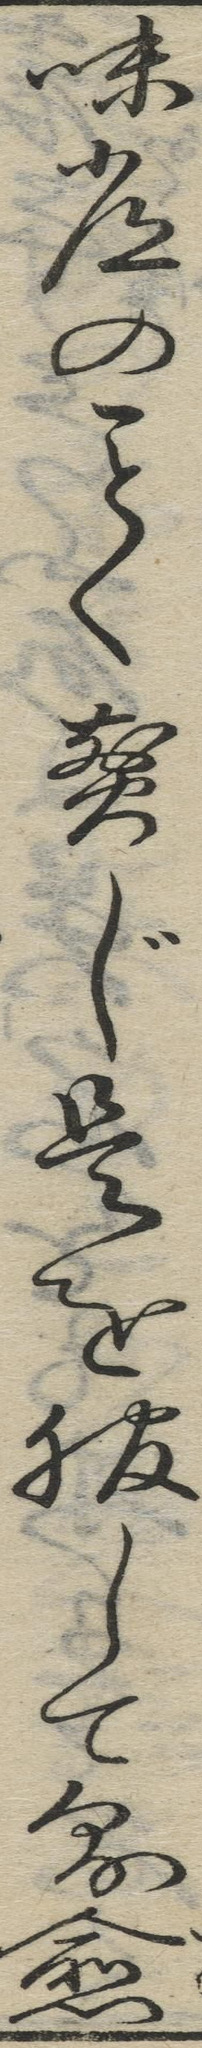味常のことく煎じ是を服して愈
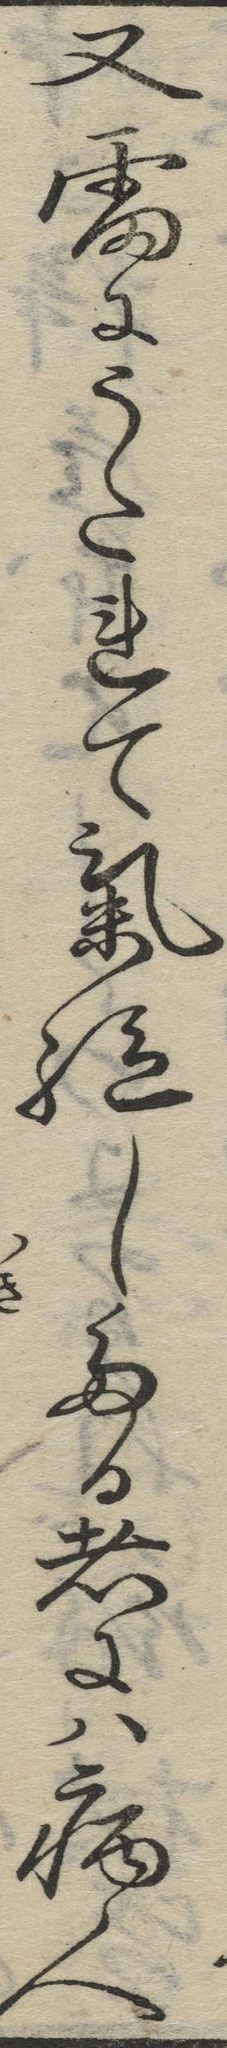又雷にうたれて氣絶したる者には病人
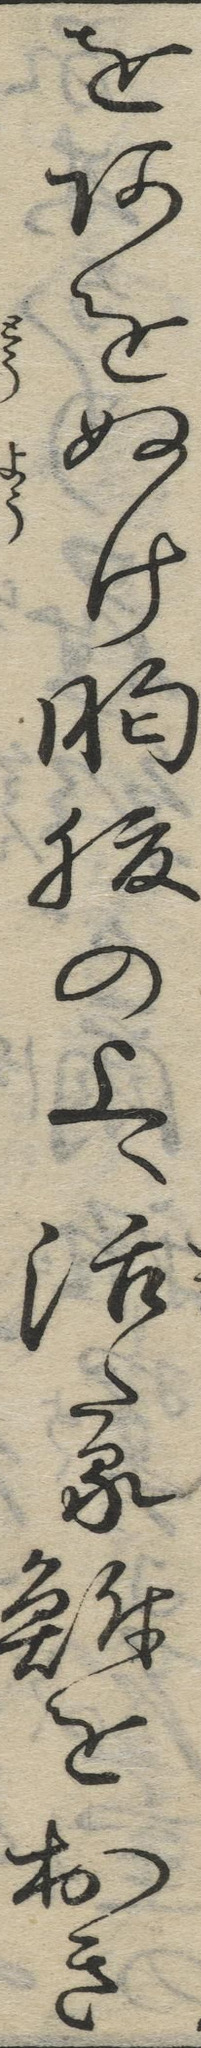を阿をぬけ胸腹の上へ活たる鮒をおき
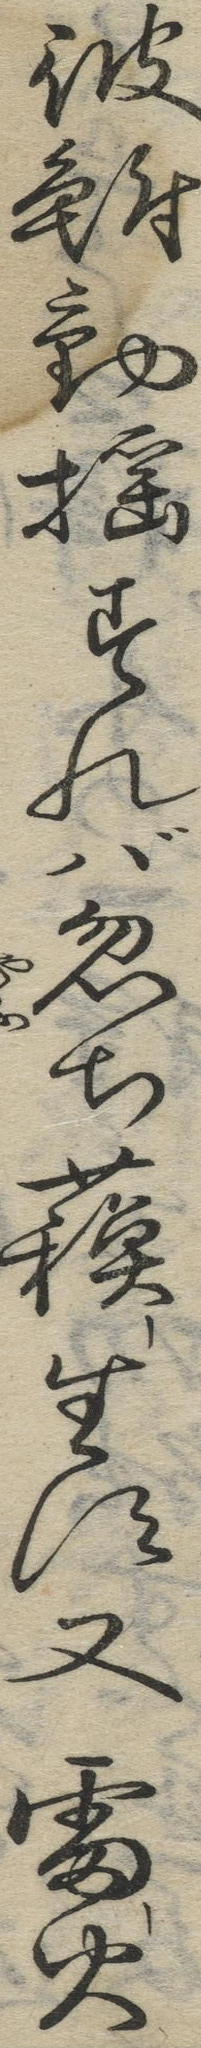彼鮒動揺すれば忽ち蘓生するまた雷火
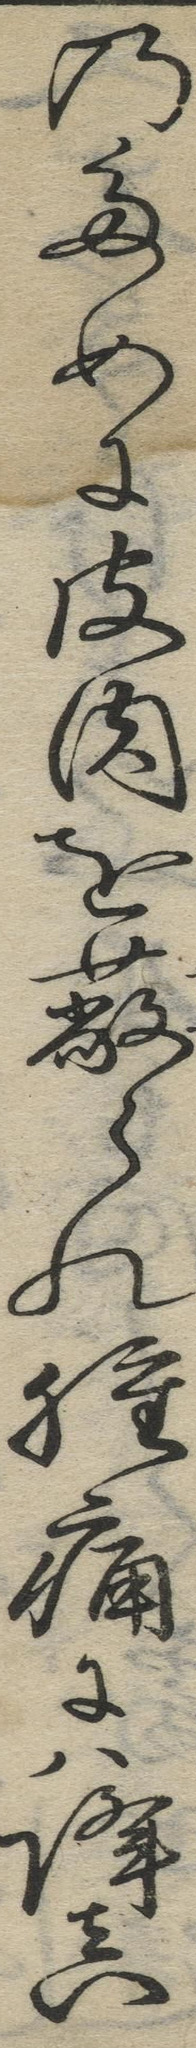のために皮肉を蔽られ腫痛には降真
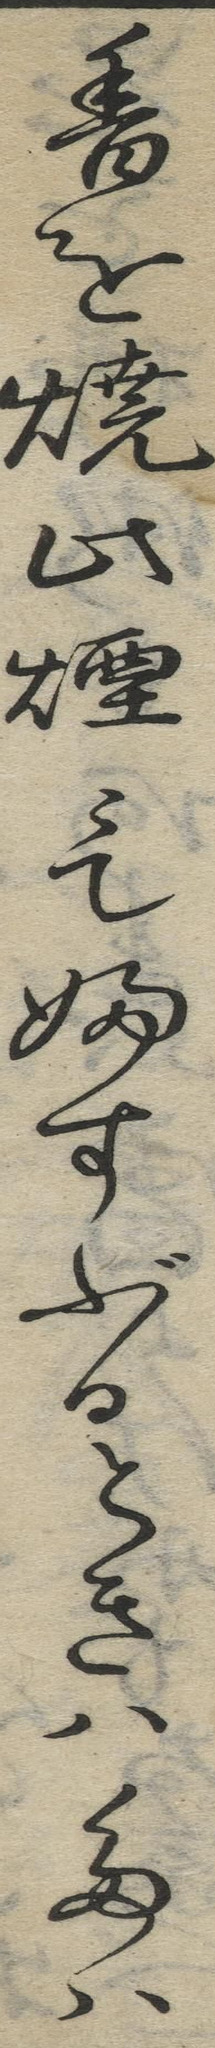香を焼此煙にてふすぶるときは多は
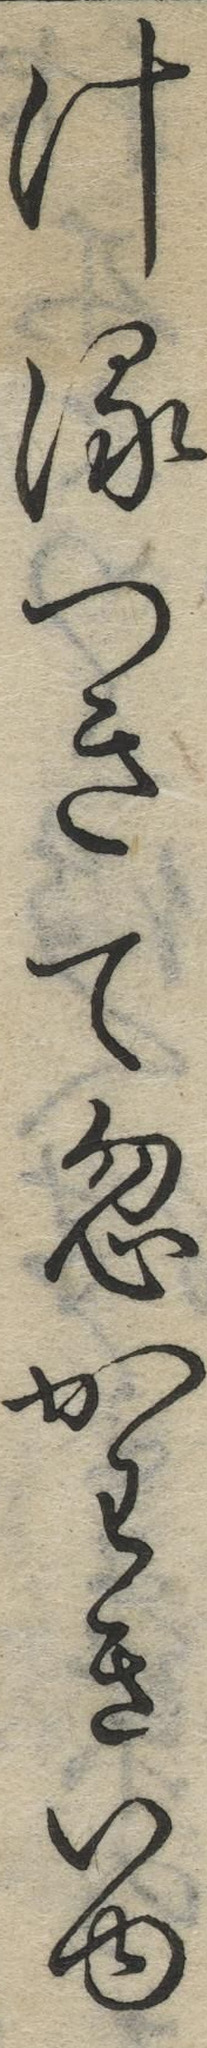汁流つきて忽ちかわきいゆ
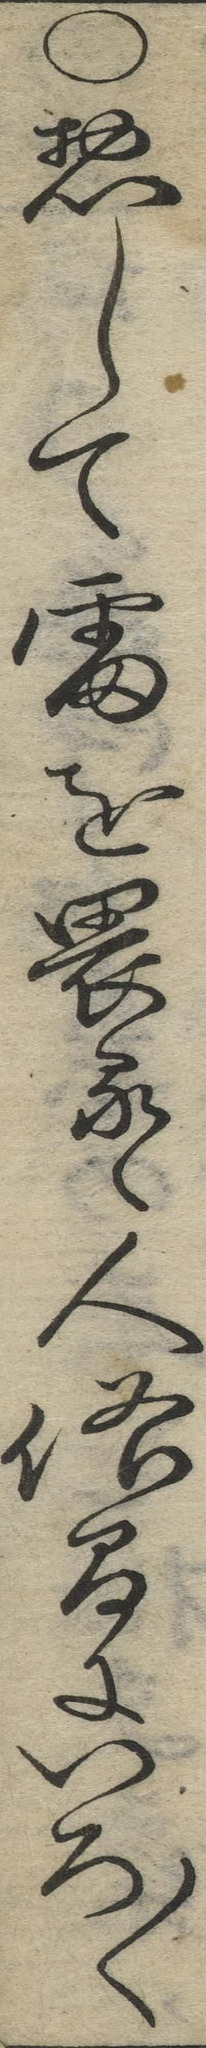惣じて雷を畏るる人俗間にいろ〳〵

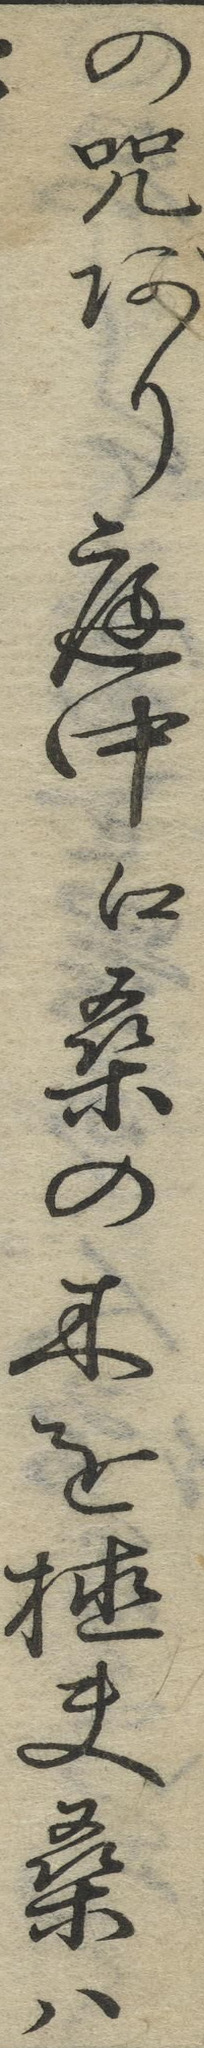の呪あり庭中に桑の木を植夫桑ハ
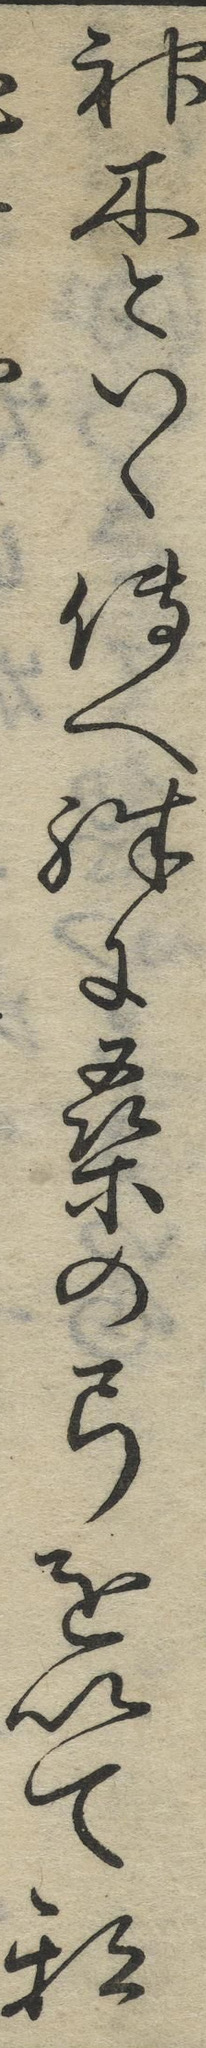神木といゝ伝へ殊に桑の弓を以て邪
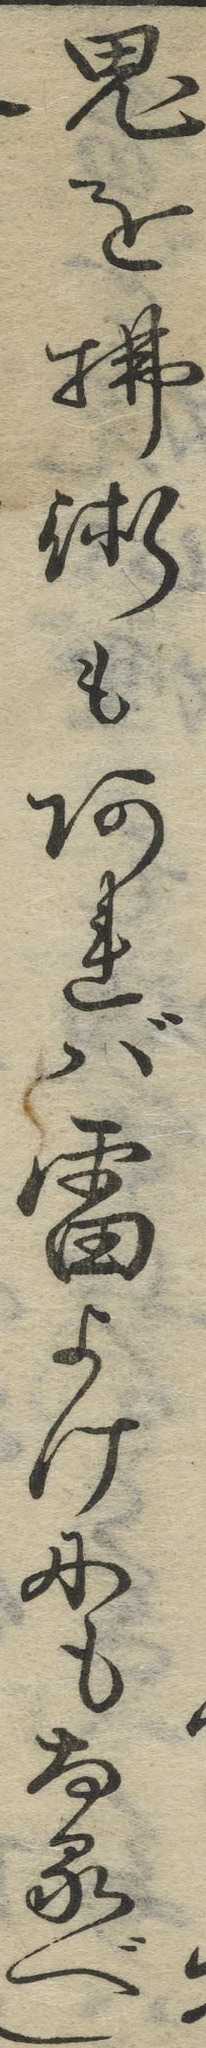鬼を払術もあれば雷よけにもなるべし
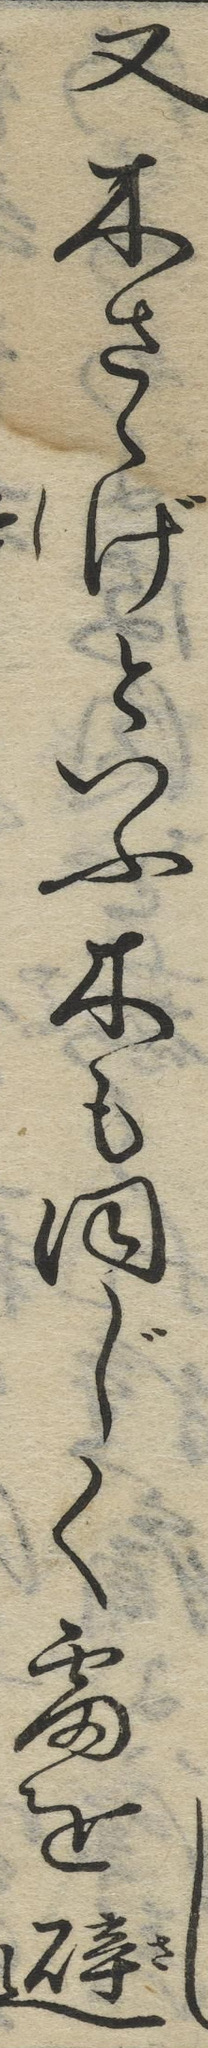又木さゝげといふ木も同じく雷を避
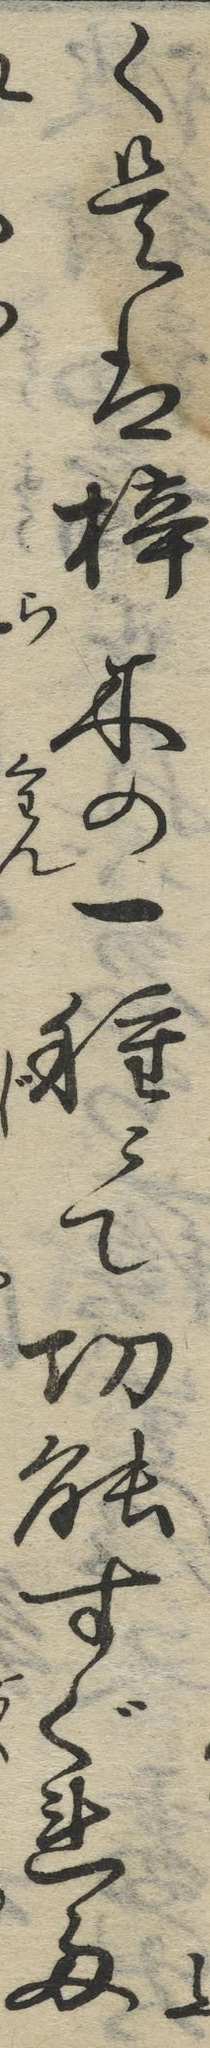く是は梓木の一種にて功能すぐれた
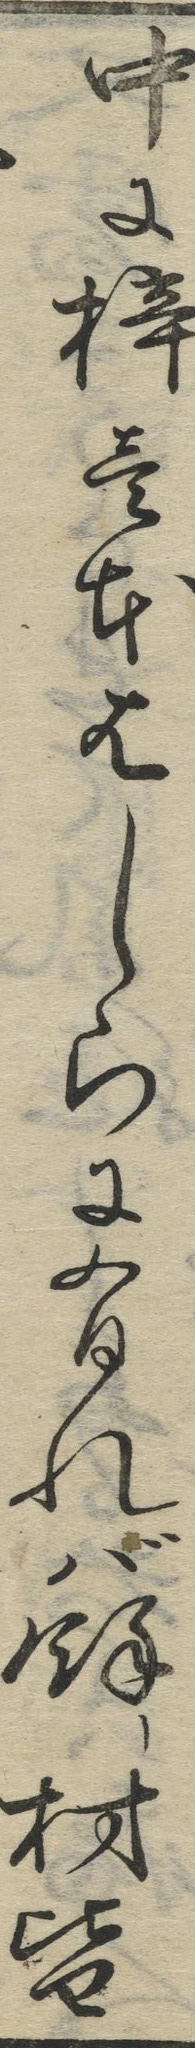中に梓壱本はしらに有てバ餘村皆
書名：雷震記　完
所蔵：東京大学地震研究所図書室 Earthquake Research Institute Library, The University of Tokyo, JAPAN
